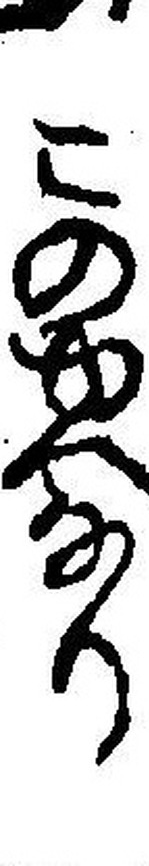このゆへなり

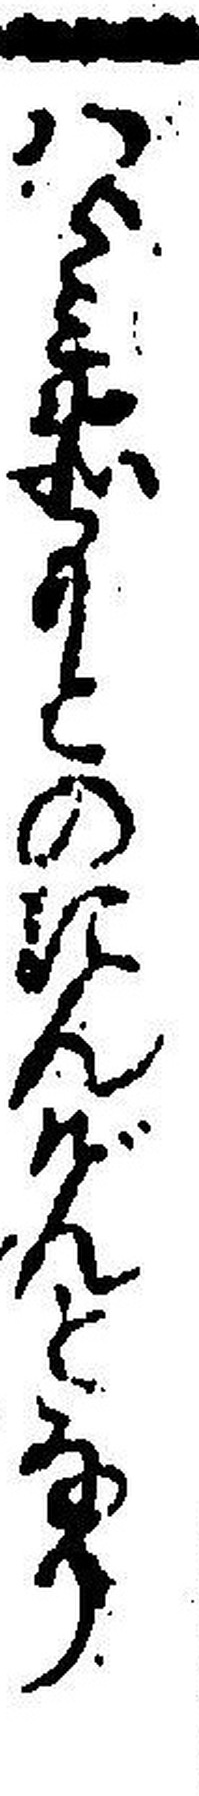八郎兵衛もとのにんげんとなり
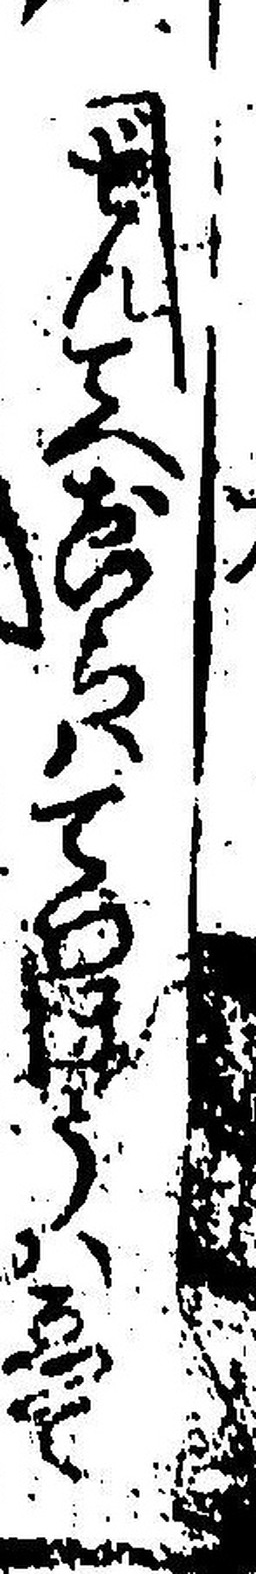〽ぜんてへおいらはてつほうはゑて
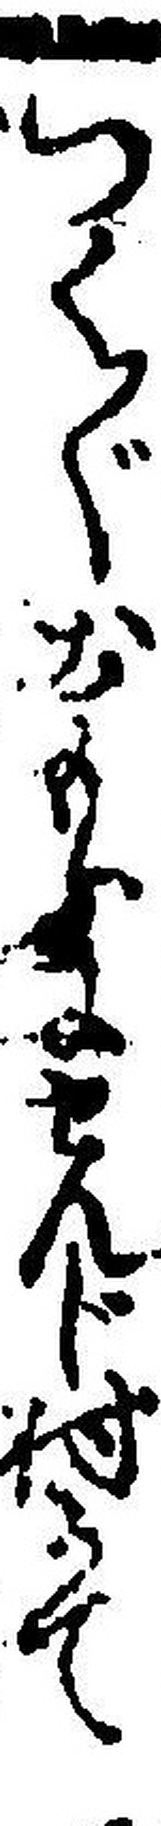つく〳〵おもふにせんじ村にて
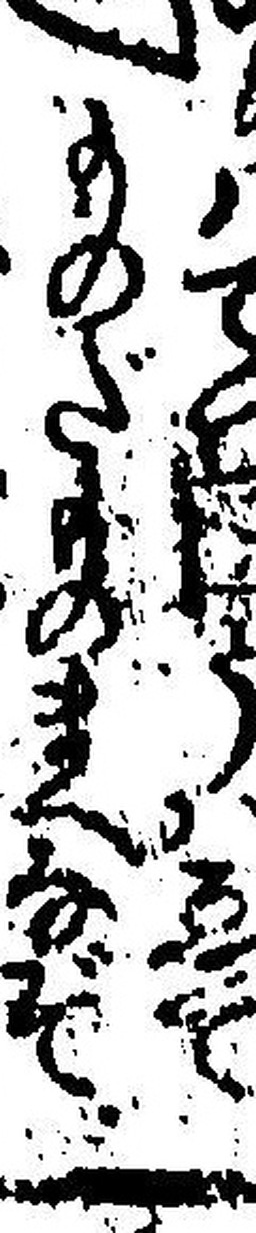ものだものまへなぞ
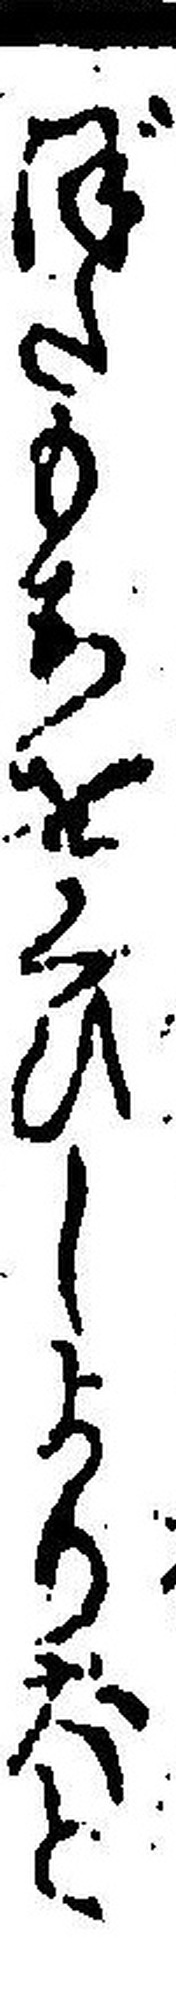ぼたもちをくひしより犬と
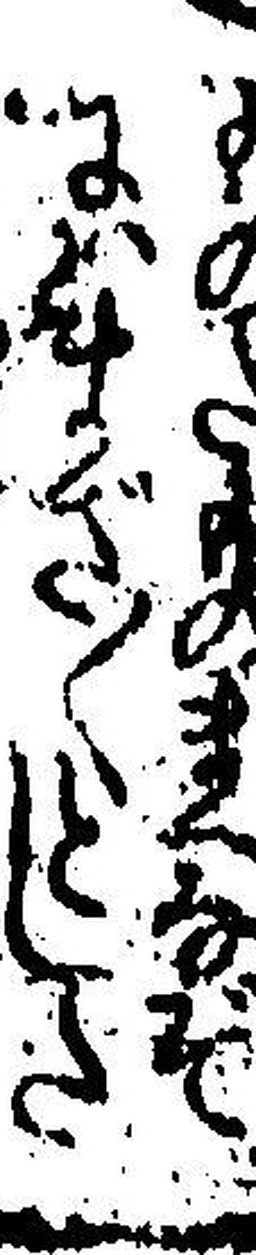にはまざ〳〵とした
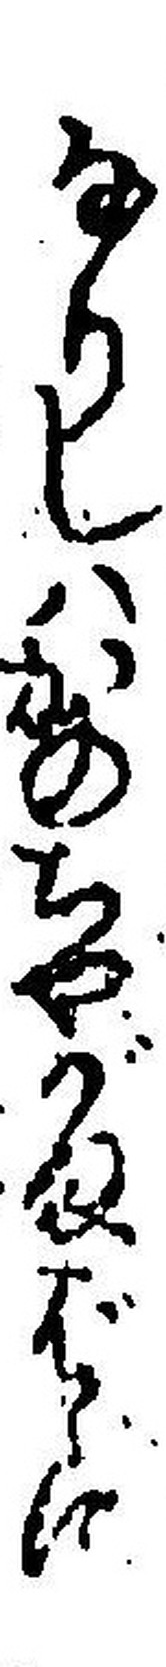なりしはかのちやがまばゞに
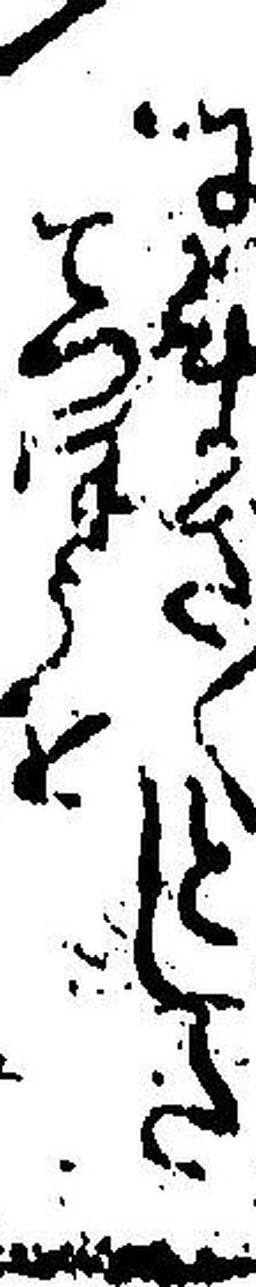てつほうを
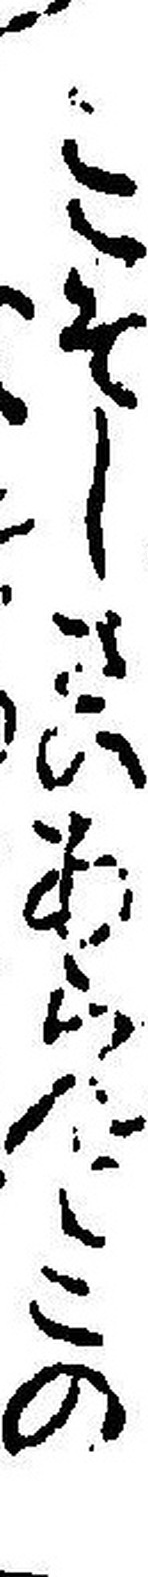こそしさいあらんとこの
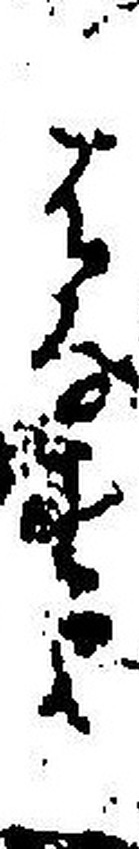はなすよ
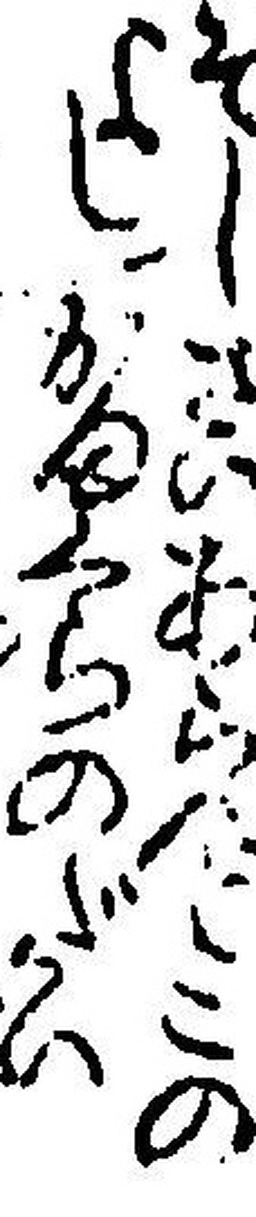よしかまくらのだい
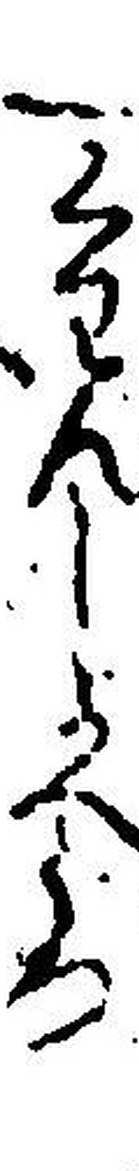くわんしよへうつ
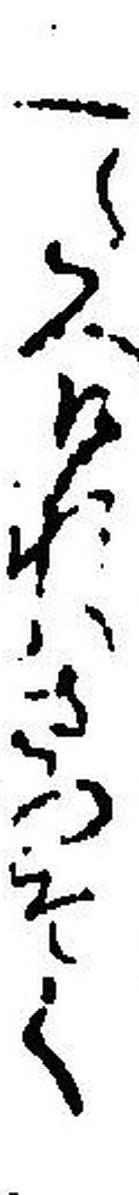たへけれはさつそく
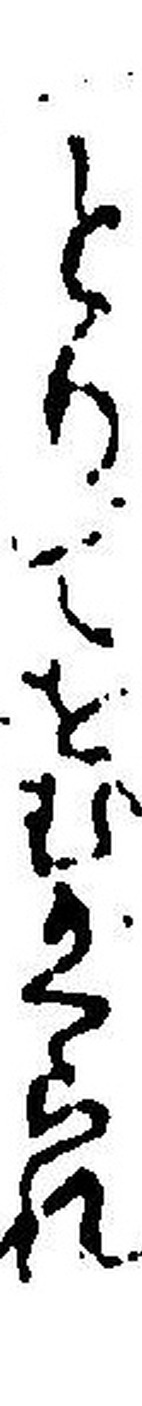とりてをむかへられ
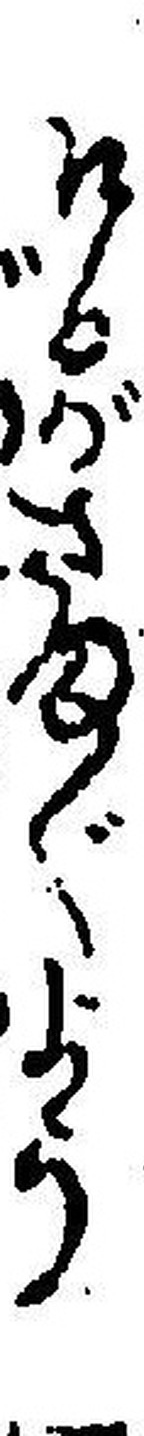けるがさま〴〵よう
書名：花芳野犬斑 / 山東京伝作
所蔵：東京大学総合図書館 General Library in the University of Tokyo, JAPAN
